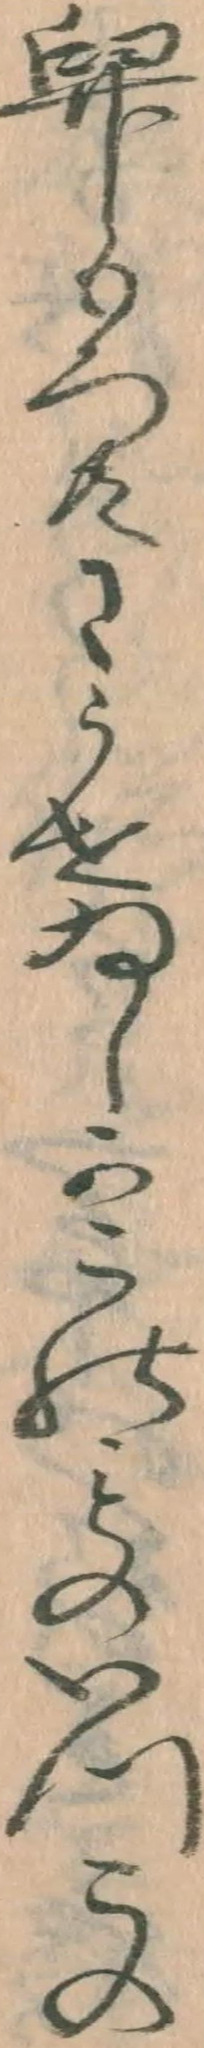舁もろ共にうせゐしかこのものいつこの
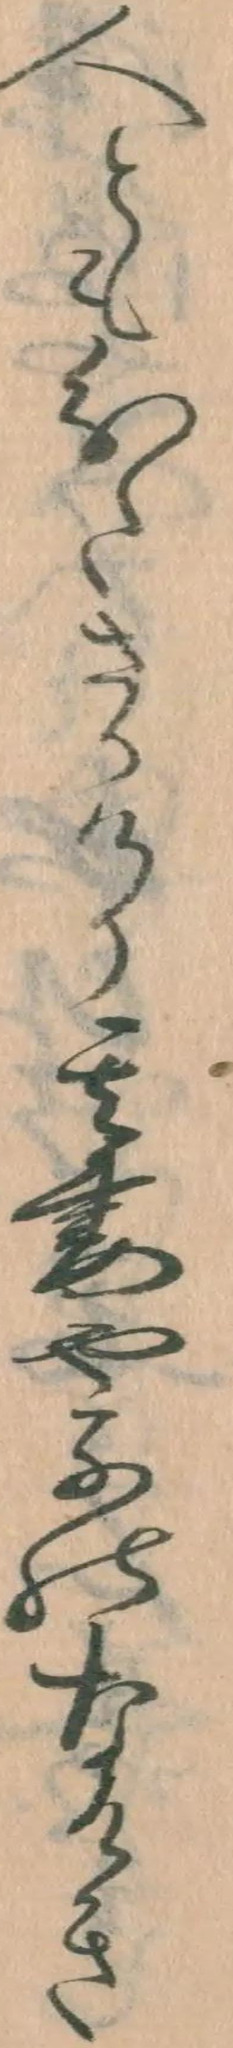人とも分たさりけり其妻や子のなけき
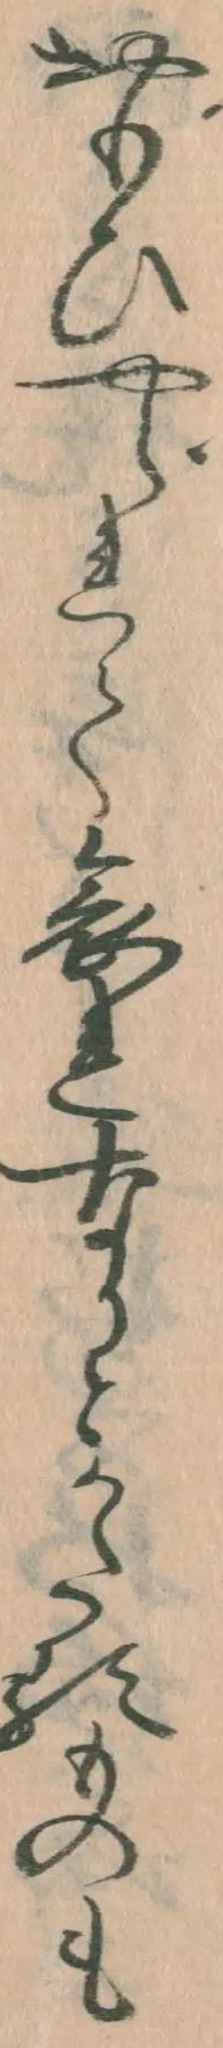おもひやられて哀れなりとかたるものも
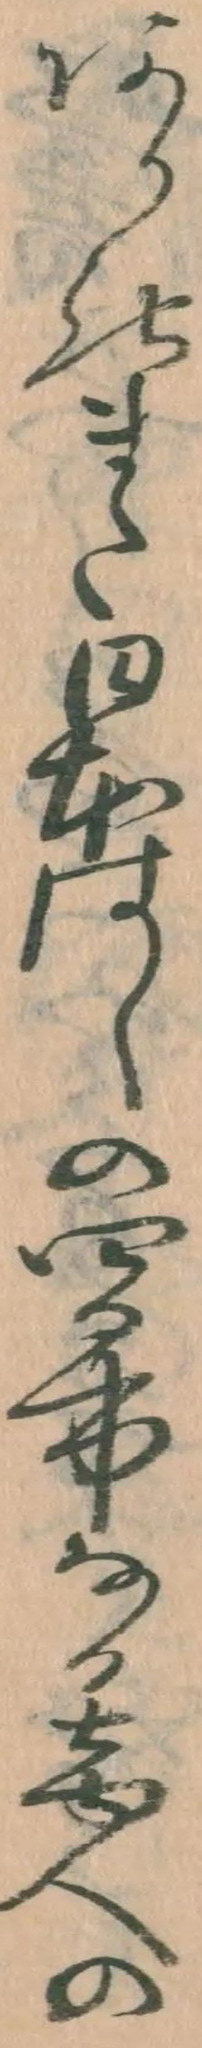ありきまた日本はしの四日市なる商人の
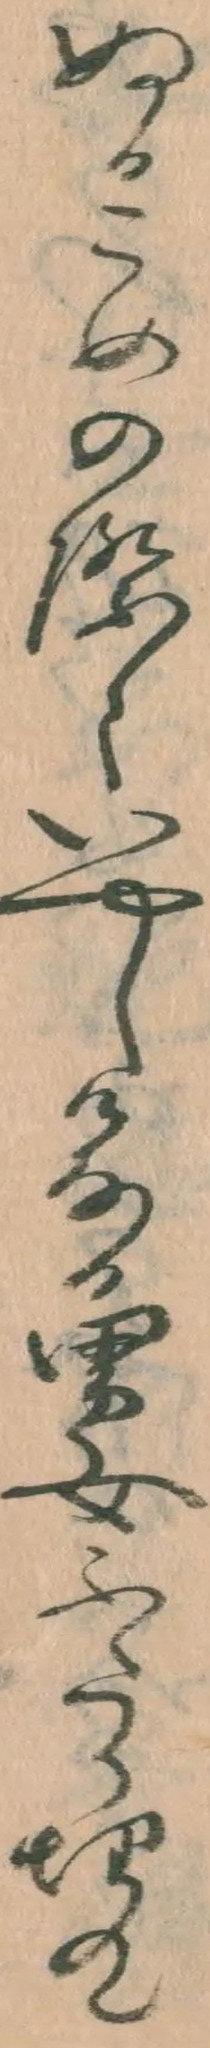ぬりこめの際にいやしけなる男女ふたり埋れ
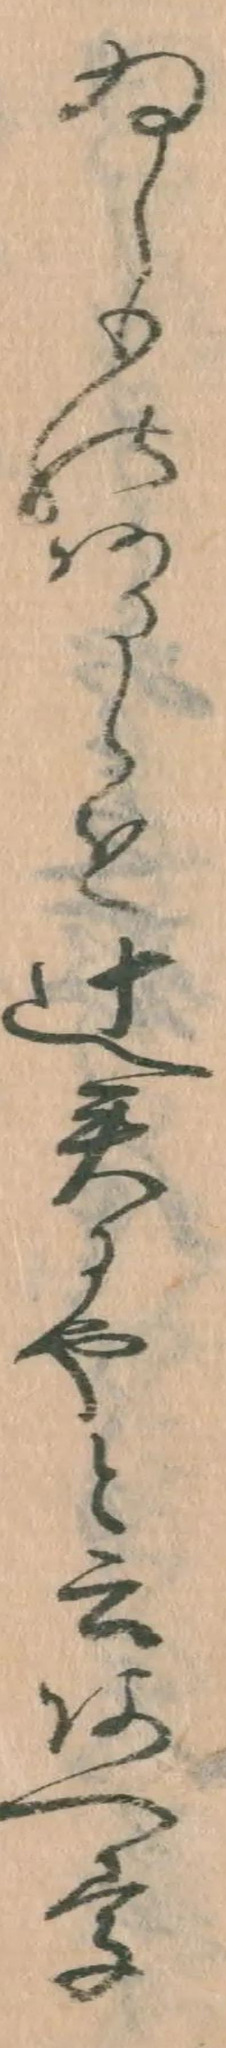ゐしものありしを辻君にやと云あへり
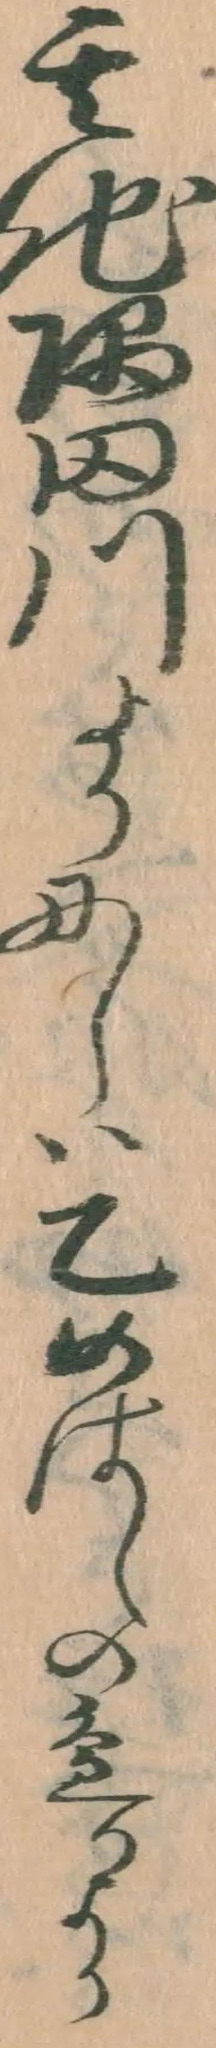其他隅田川よりにしハ乙めはしの邊りより
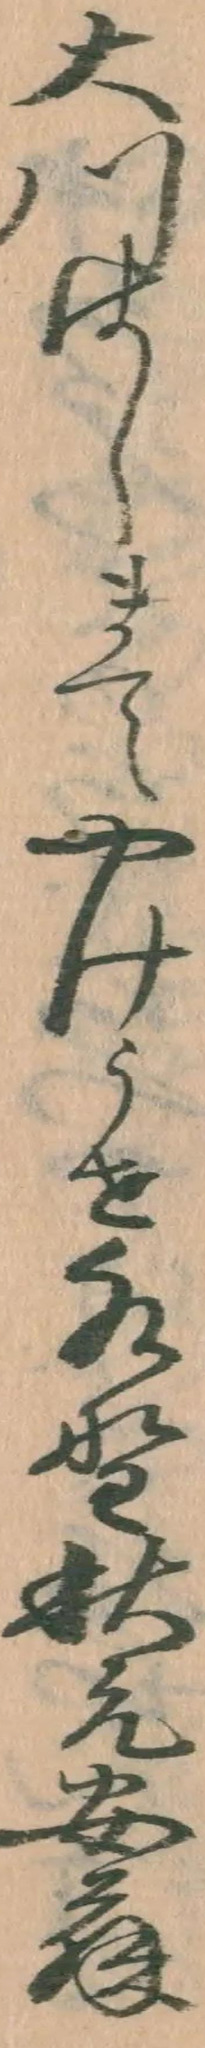大川はしまてやけうせ水野秋元安藤
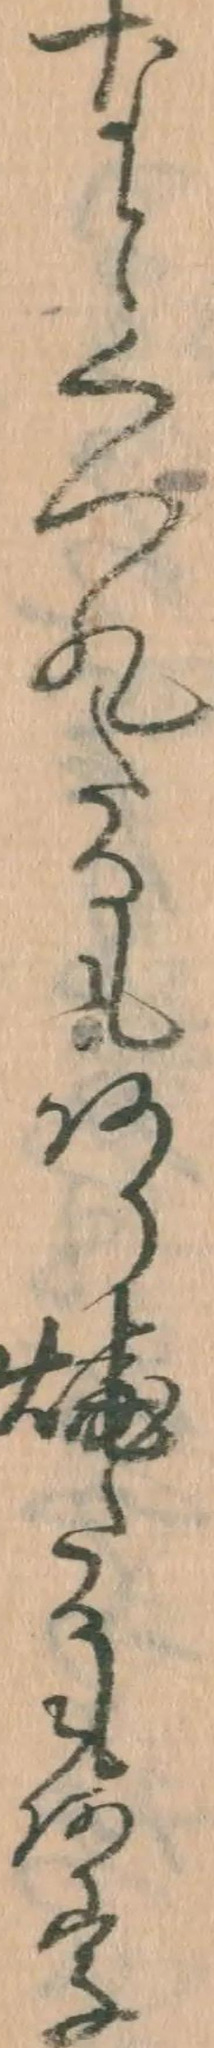なとくつれたるもあり燒たるもあり
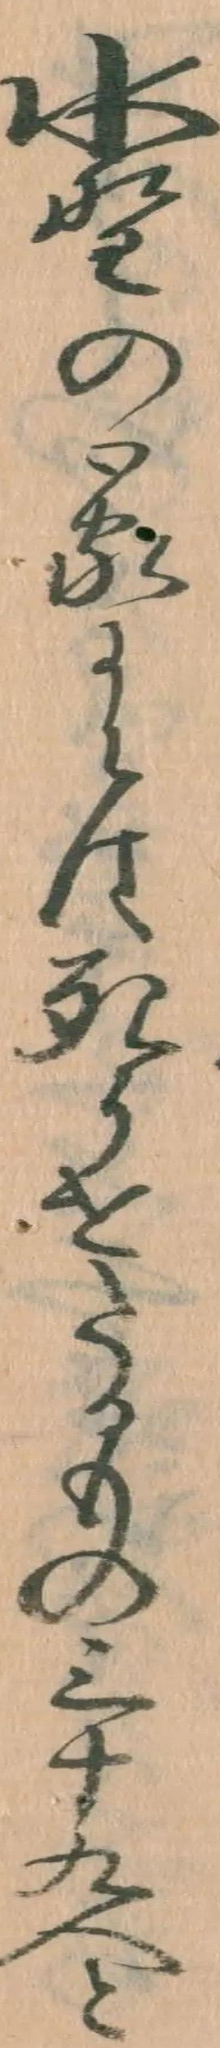水野の御家にては死うせたるもの三十九人と
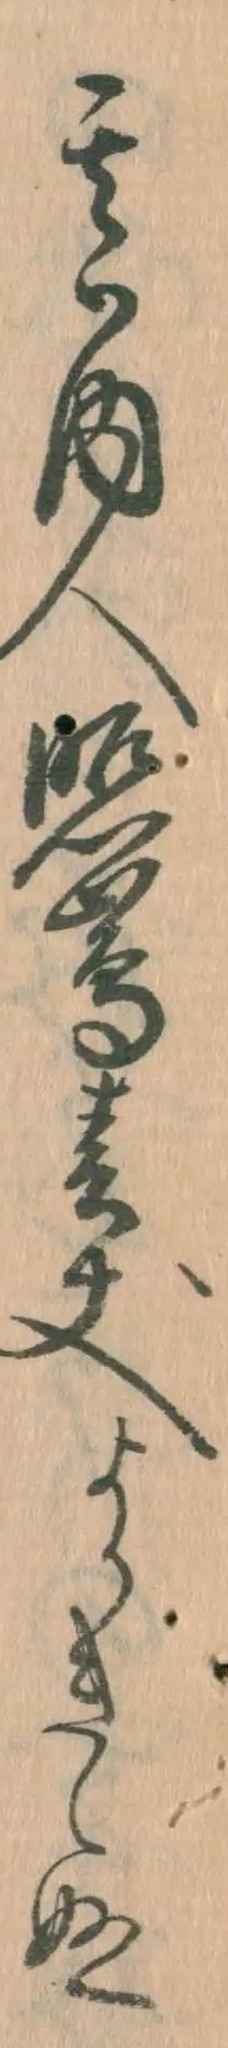其御内人照嶋春丈よりきヽぬ
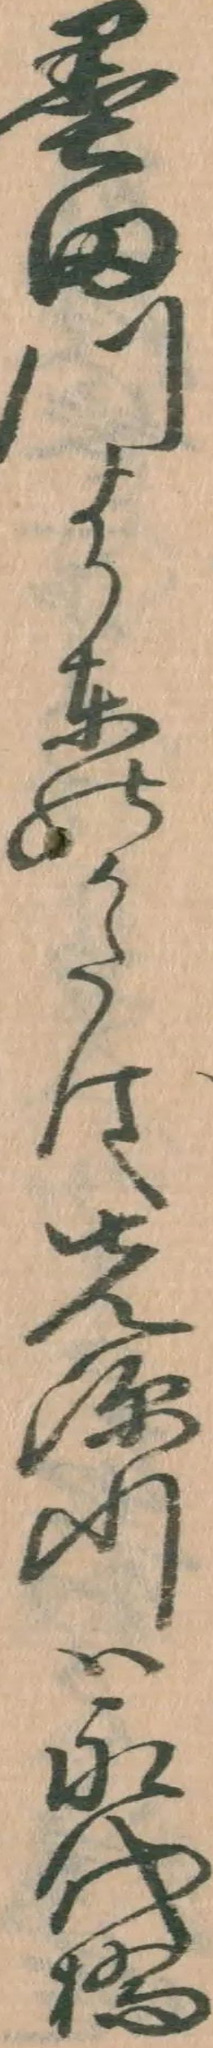墨田川より東のかたは先深川ハ永代橋
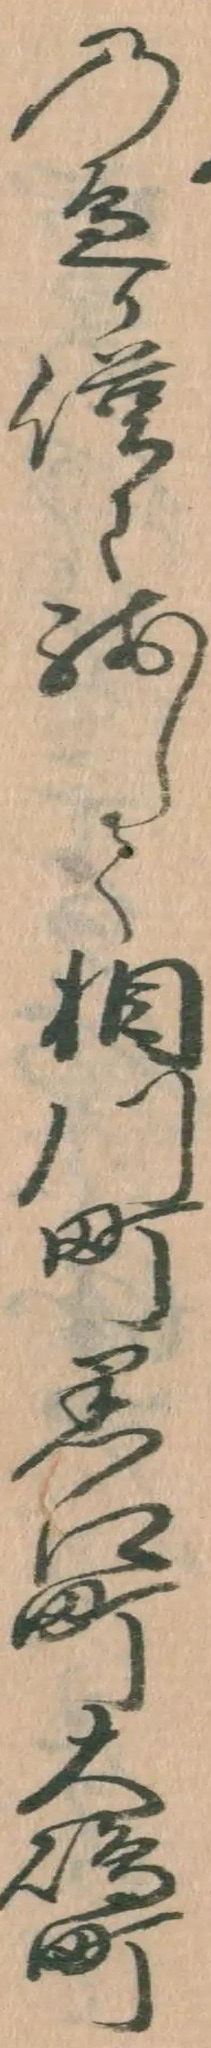の邊り僅に残して相川町黒江町大嶋町
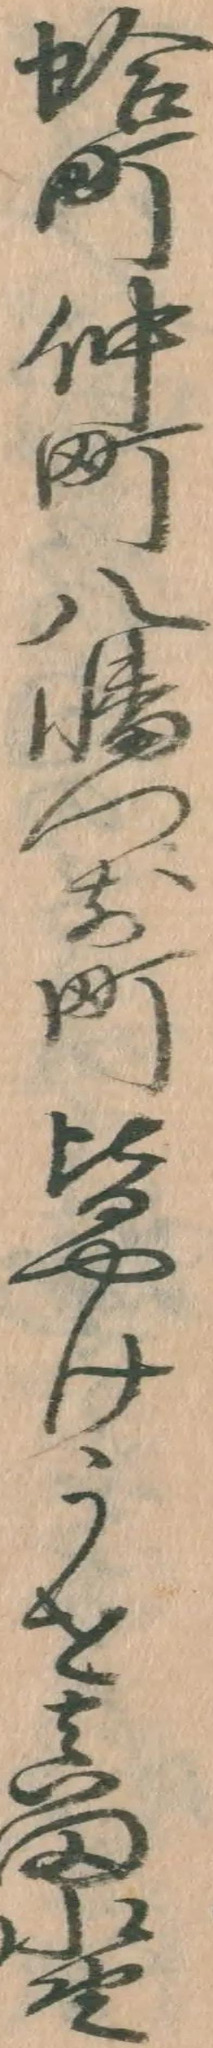蛤町仲町八幡門前町皆やけうせ真田水野
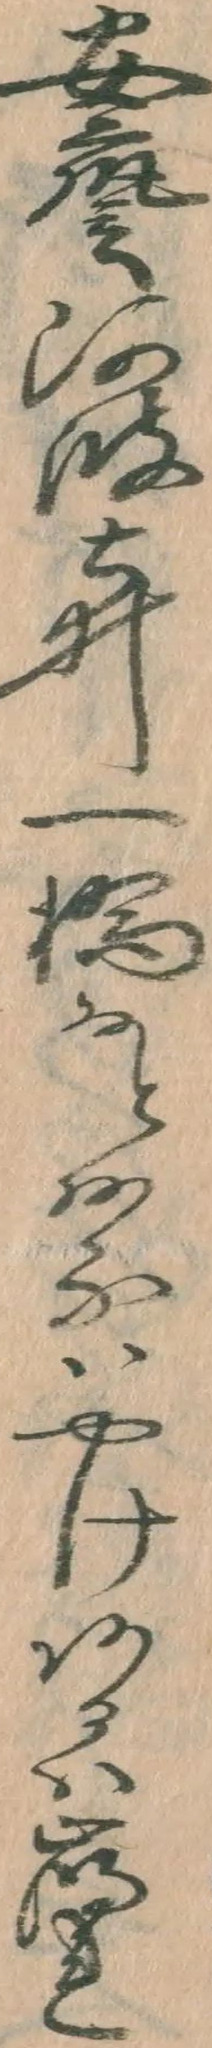安藝阿波土井一橋なとあるハやけあるハ崩れ
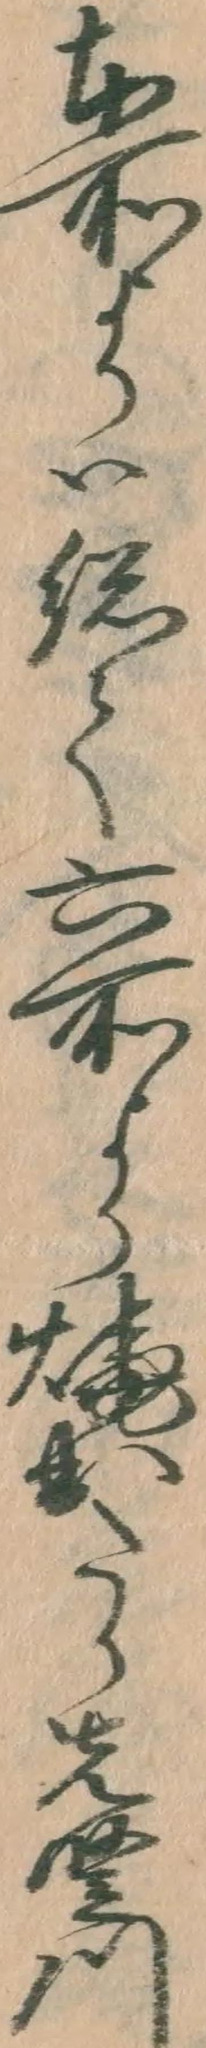本所よりハ総て六所より燒出たり先竪川
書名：麗斎叢書. 20
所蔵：国立国会図書館 National Diet Library, JAPAN
